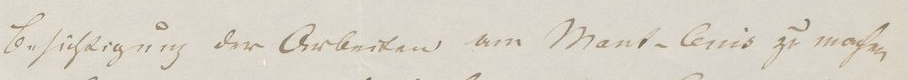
Besichtigung der Arbeiten am Mont-Cenis zu machen
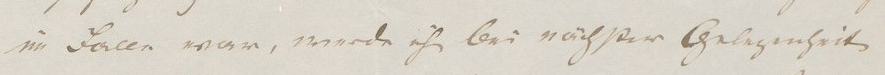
im Falle war, werde ich bei nächster Gelegenheit
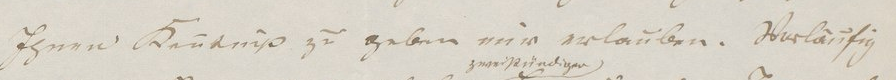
Ihnen Kenntniß zu geben mir erlauben. Vorläufig
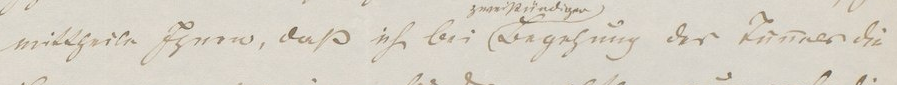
mittheile Ihnen, daß ich bei zweistündiger Begehung des Tunnels die
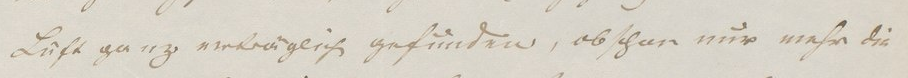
Luft ganz erträglich gefunden, obschon nur mehr die
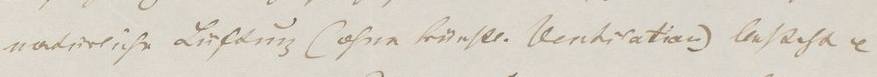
natürliche Lüftung (ohne künstl. Ventilation) besteht &
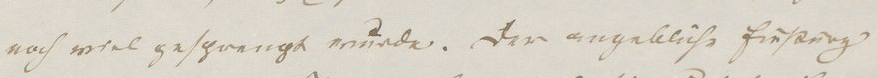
noch viel gesprengt wurde. Der angebliche Einsturz
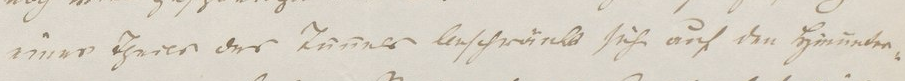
eines Theils des Tunnels beschränkt sich auf den Hinunter-
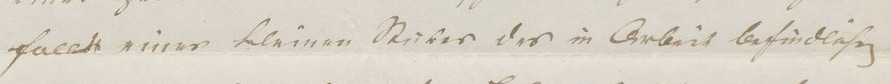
fall eines kleinen Stükes des in Arbeit befindlichen
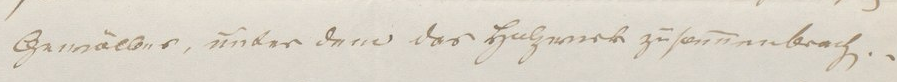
Gewölbes, unter dem das Holzwerk zusammenbrach. –
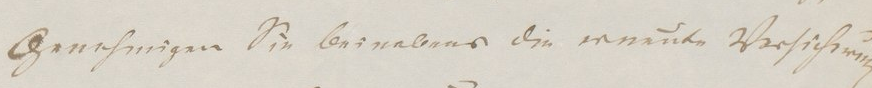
Genehmigen Sie beinebens die erneute Versicherung
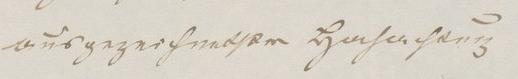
ausgezeichnetster Hochachtung
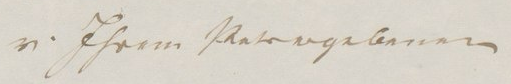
v. Ihrem stets ergebenen
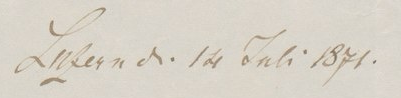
Luzern d. 14 Juli 1871.
